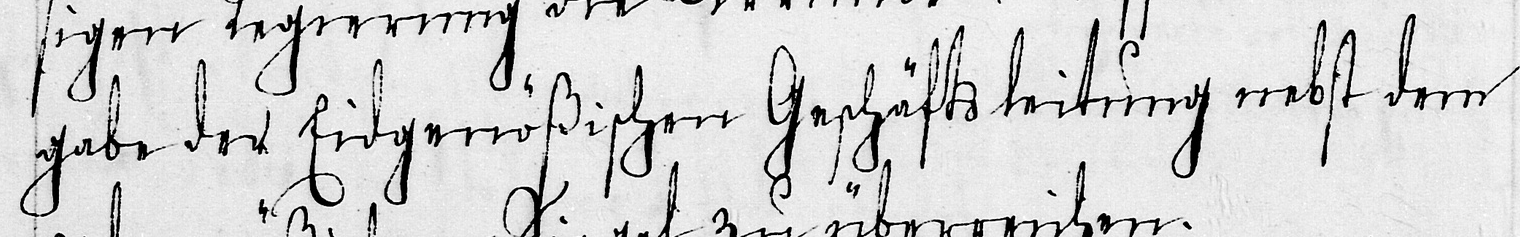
gabe der Eidgenößischen Geschäftsleitung nebst dem
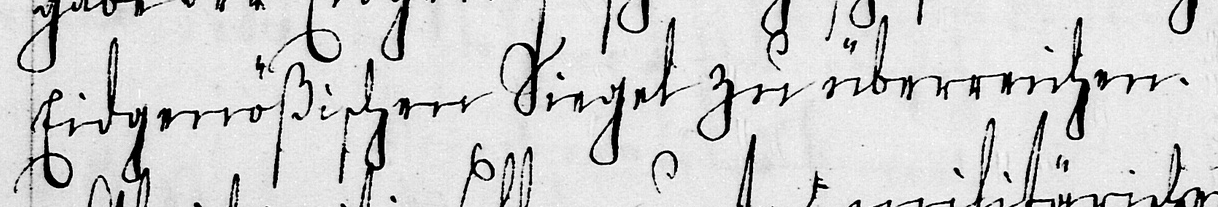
Eidgenößischen Siegel zu überreichen.
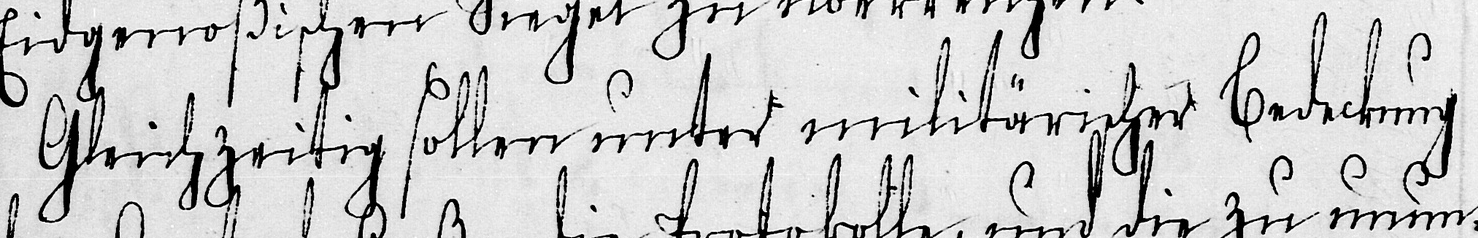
Gleichzeitig sollen unter militärischer Bedeckung
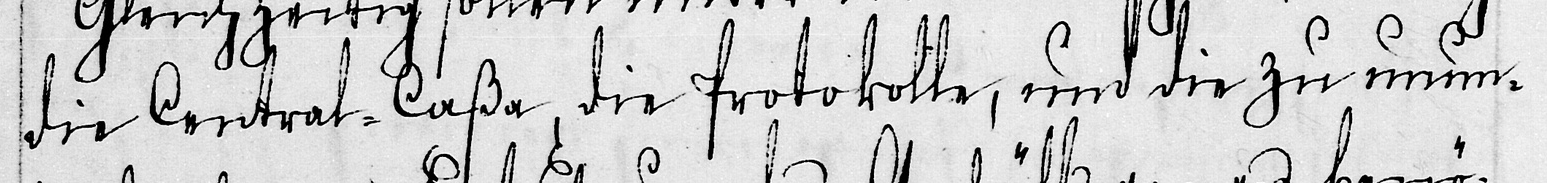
die Central-Caßa, die Protokolle, und die zu unun¬
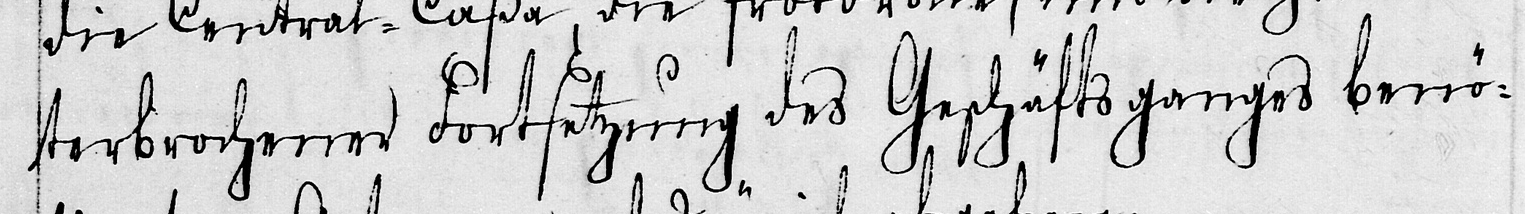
terbrochener Fortsetzung des Geschäftsganges benö¬
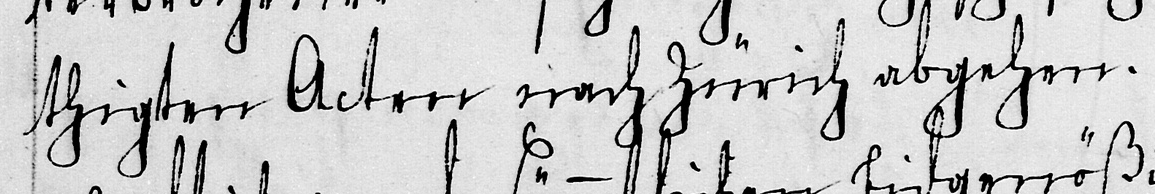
thigten Acten nach Zürich abgehen.
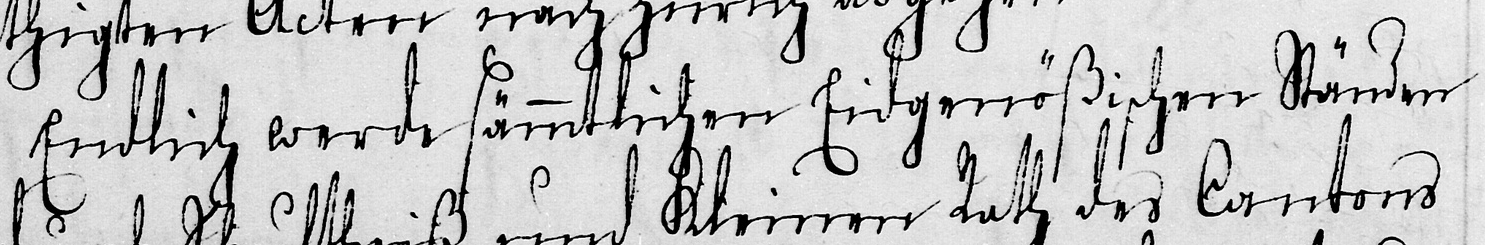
Endlich werde sämmtlichen Eidgenößischen Ständen
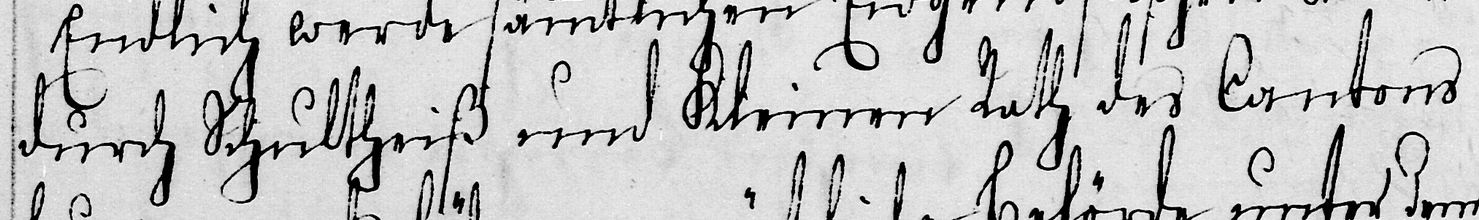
durch Schultheiß und Kleinen Rath des Cantons
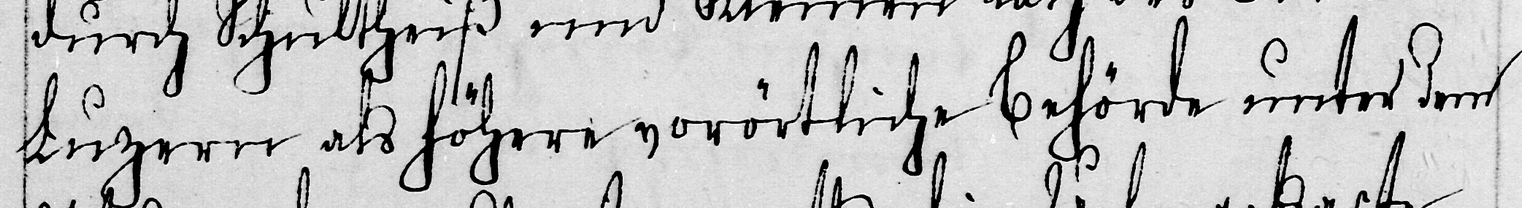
Luzern als höhere vorörtliche Behörde unter dem
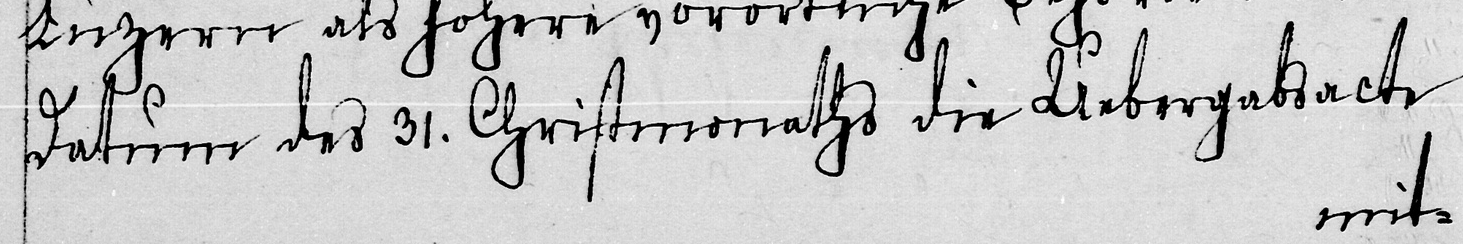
Datum des 31. Christmonaths die Uebergabsacte
